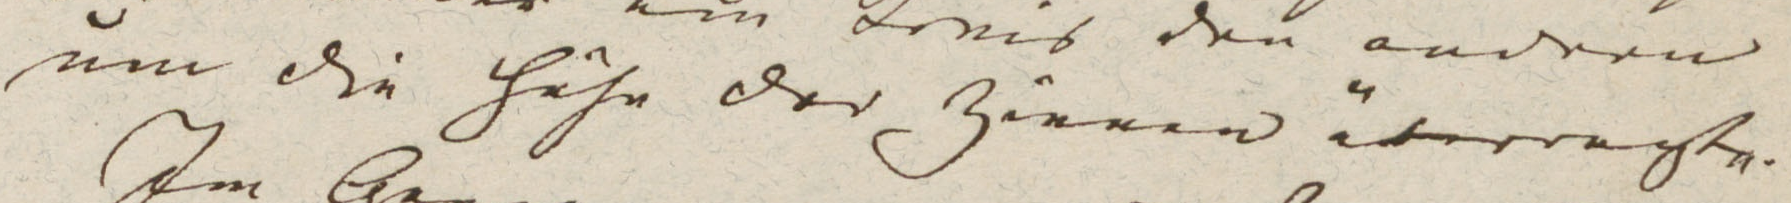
um die Höhe der Zinnen überragte.
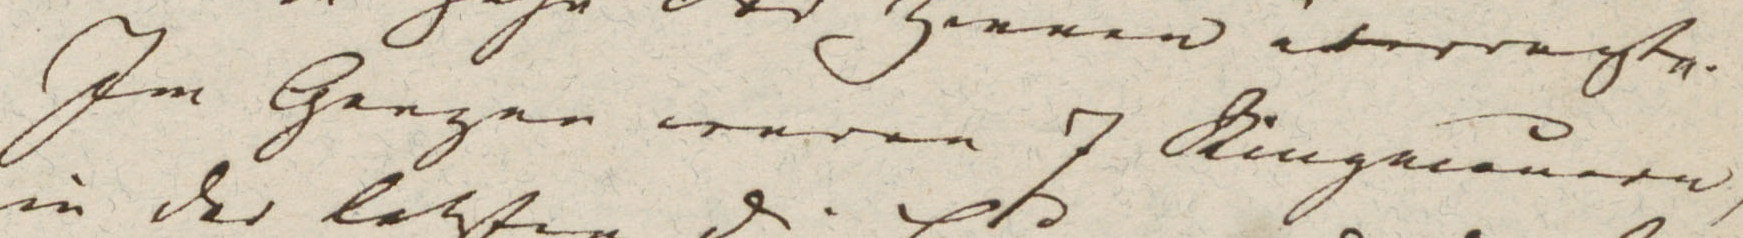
Im Ganzen waren 7 Ringmauern,
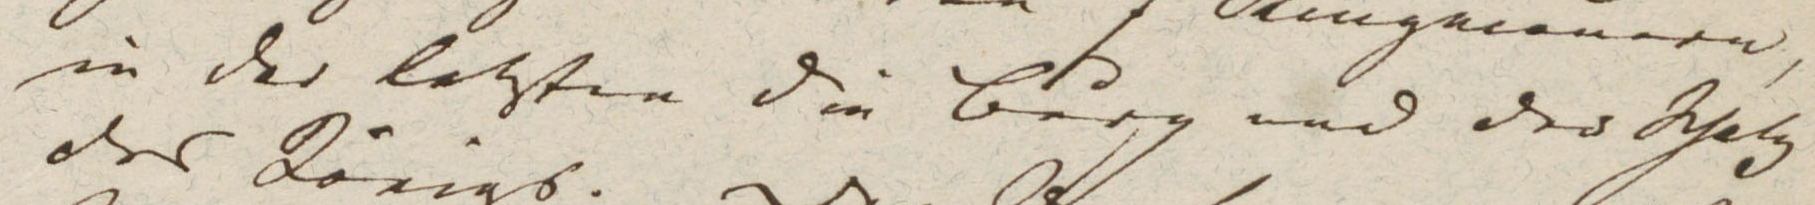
in der letzten die Burg und der Schatz
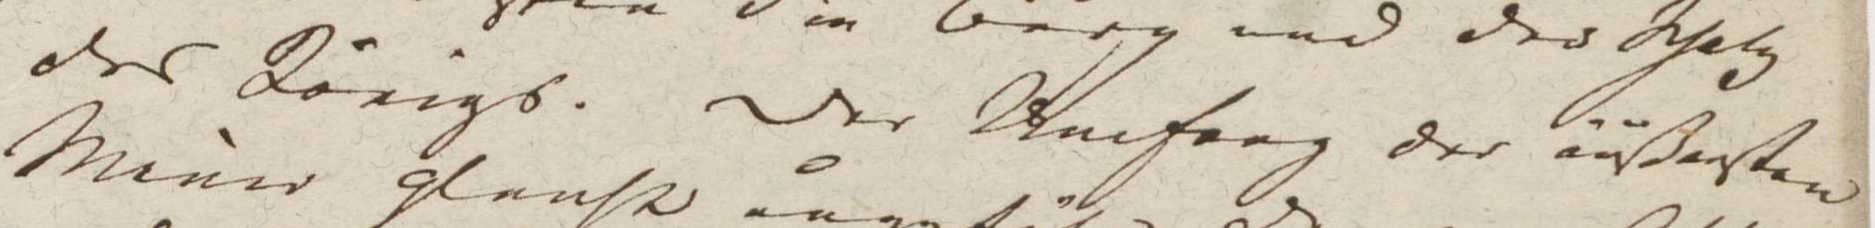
des Königs. Der Umfang der äussersten
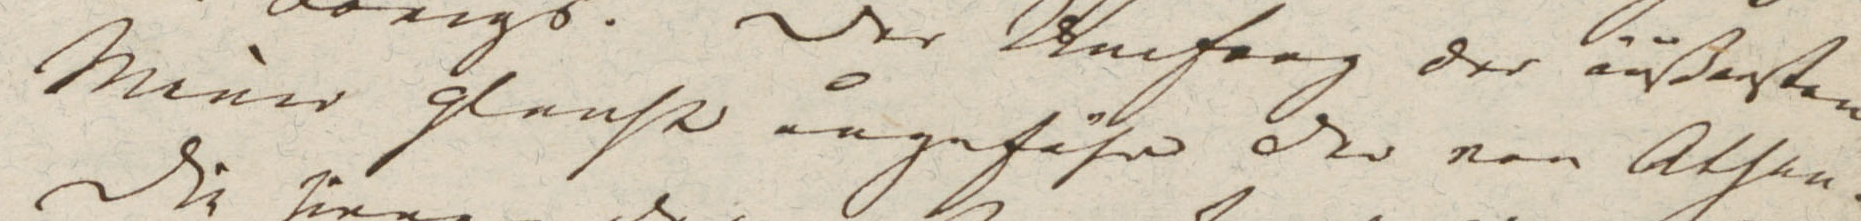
Mauer gleicht ungefähr der von Athen.
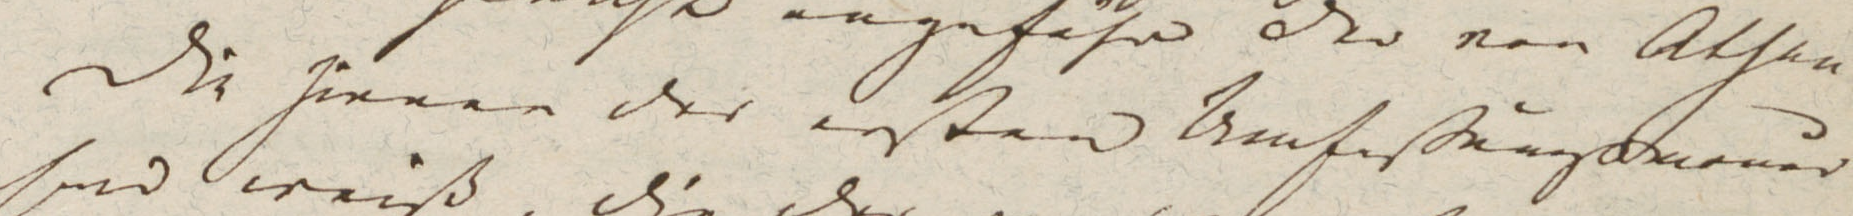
Die Zinnen der ersten Umfassungsmauer
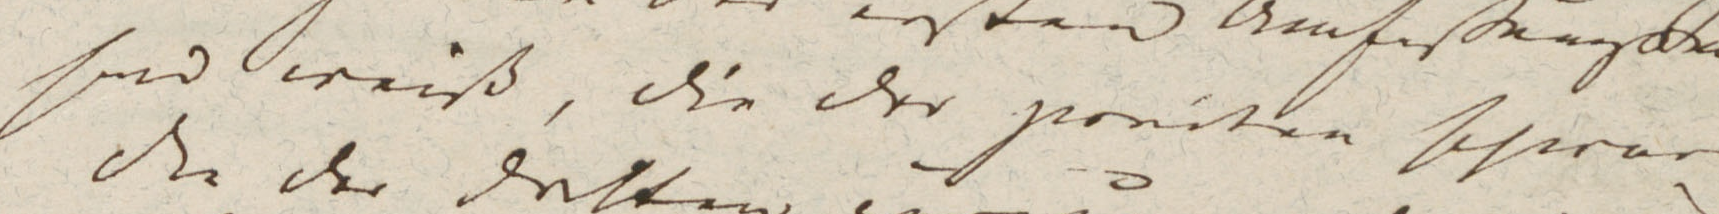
sind weiss, die der zweiten schwarz
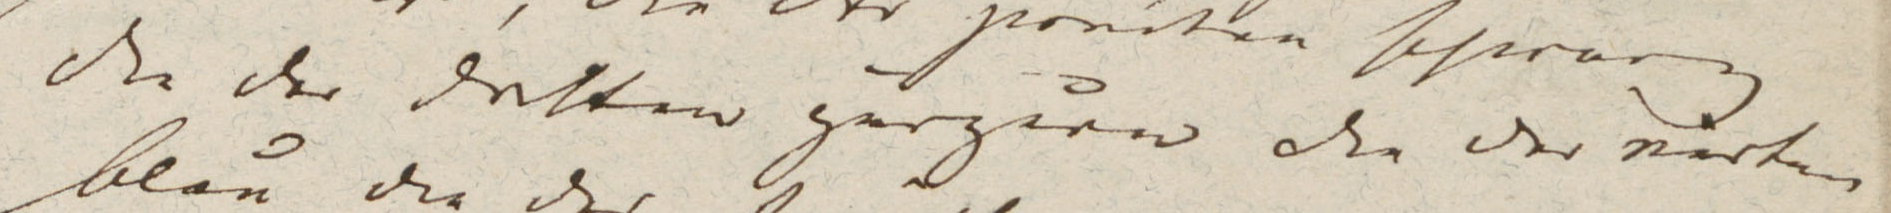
die der dritten purpurn die der vierten
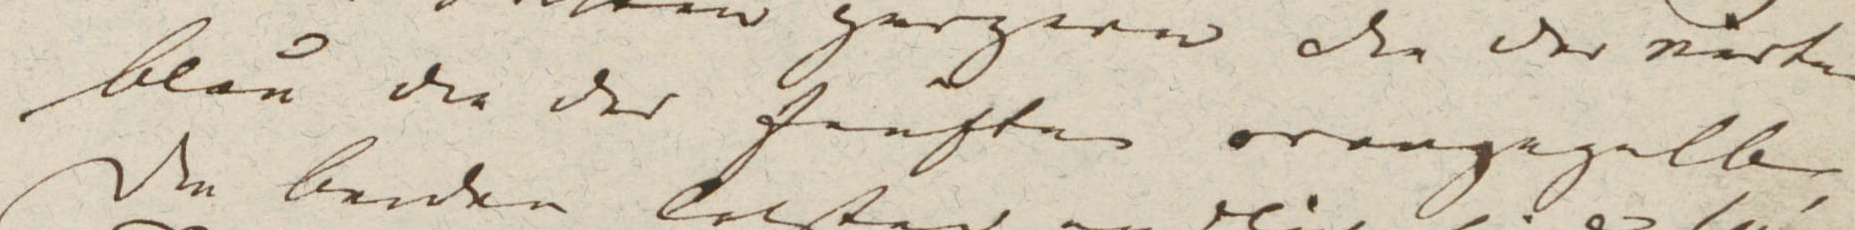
blau die der fünften orangegelb,
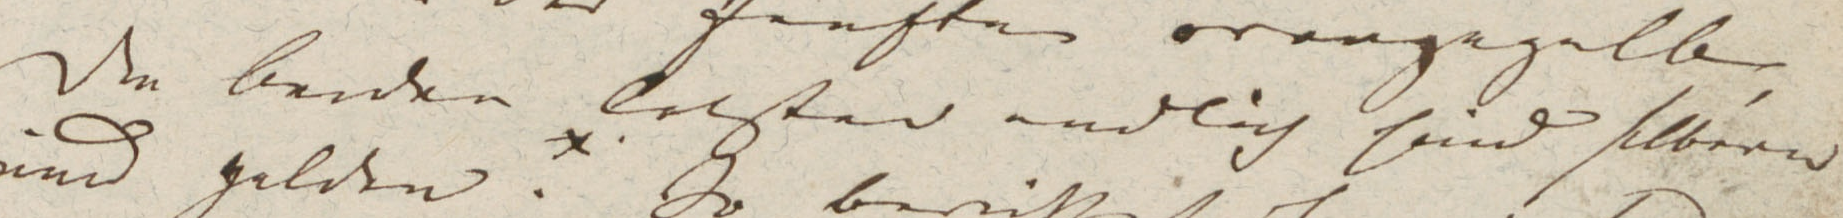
die beiden letzten endlich sind silbern
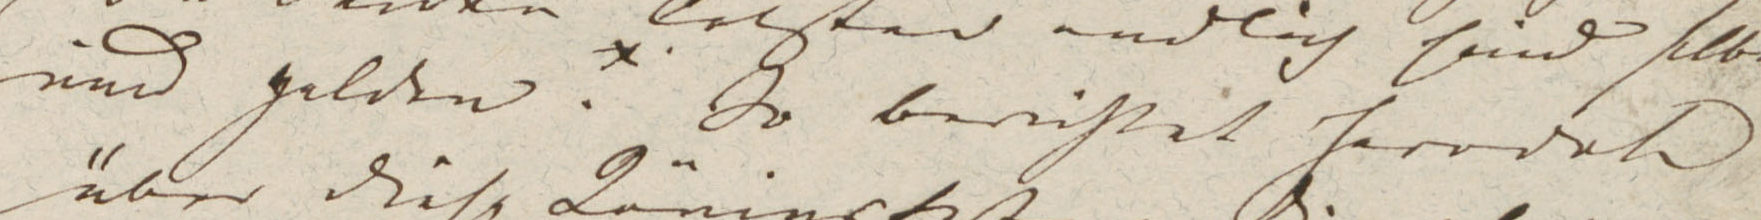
und golden. % So berichtet Herodot
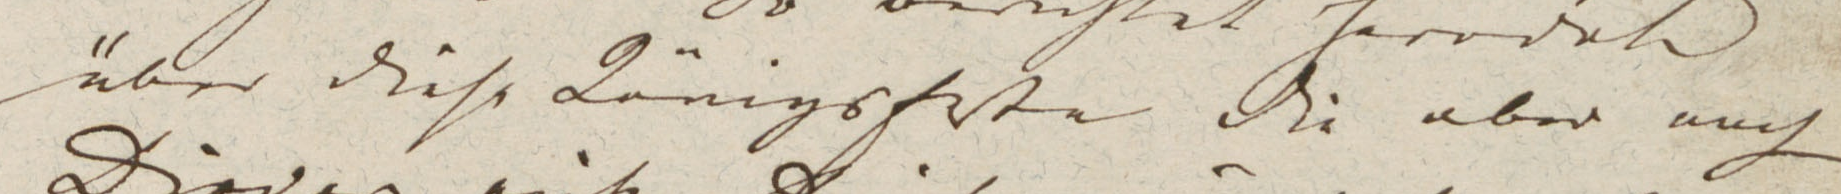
über diese Königsfeste die aber nach
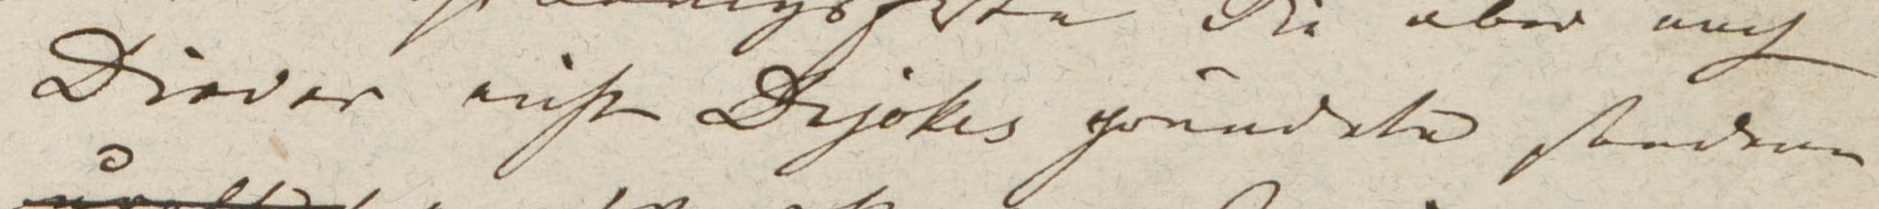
Diodor nicht Dejokes gründete sondern
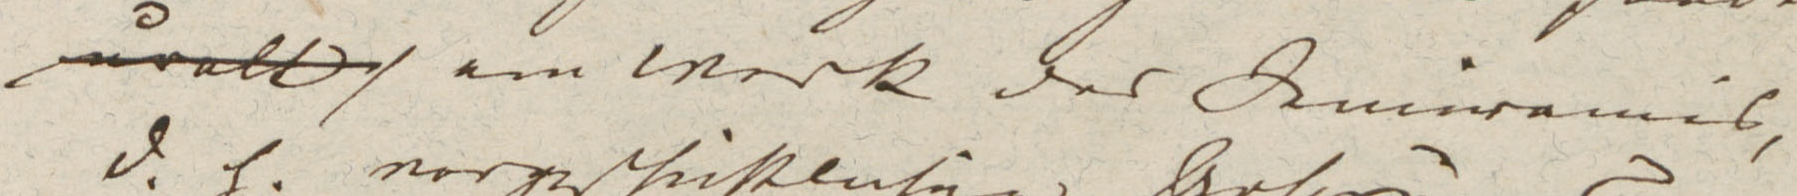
uralt s ein Werk der Semiramis,
